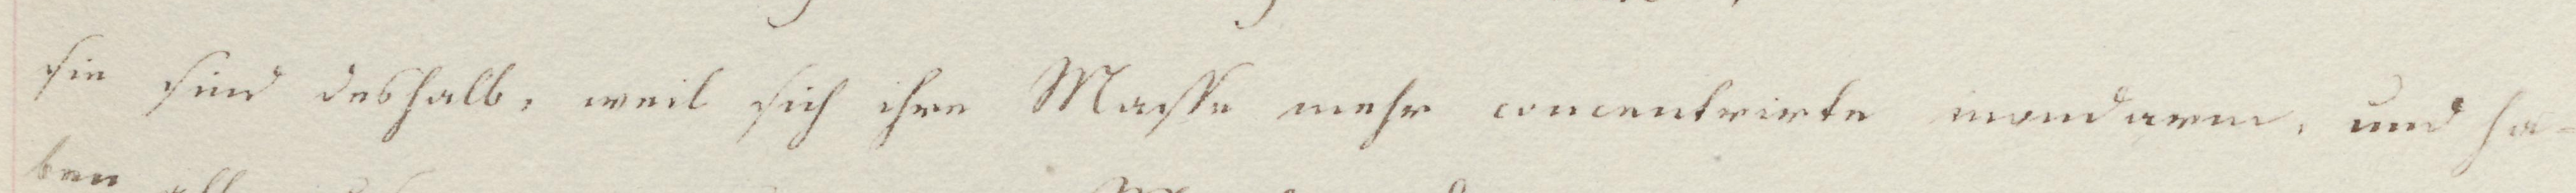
sie sind deshalb, weil sich ihre Masse mehr concentrirte mondarm, und ha-
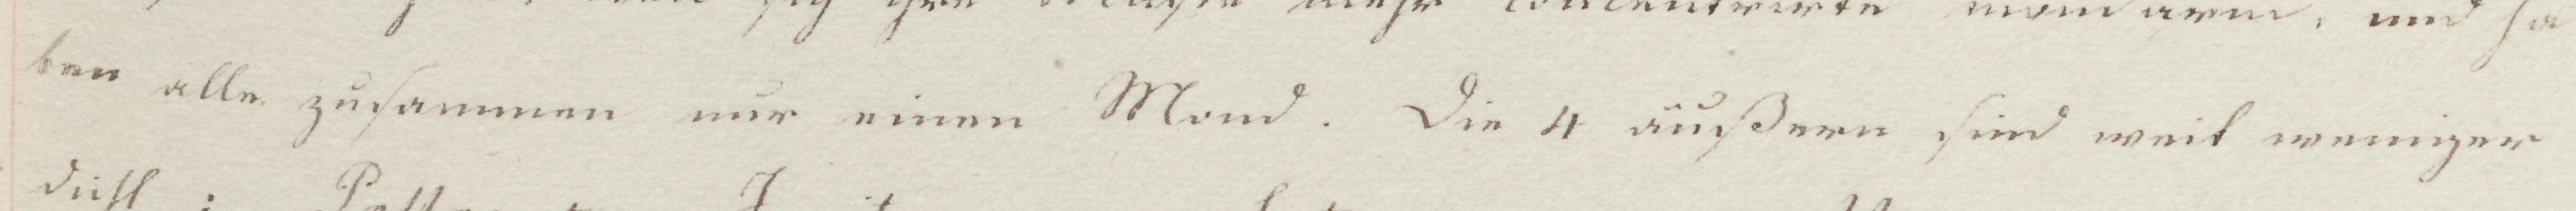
ben alle zusammen nur einen Mond. Die 4 äußern sind weit weniger
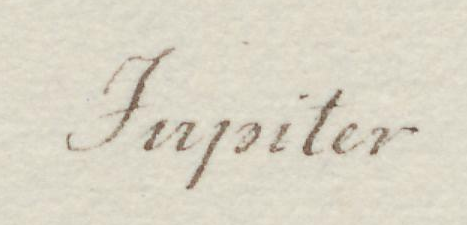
Jupiter,
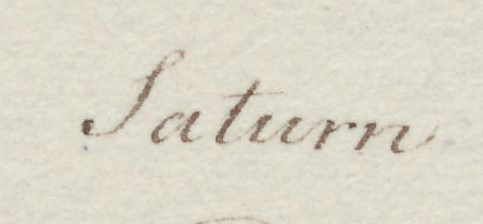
Saturn,
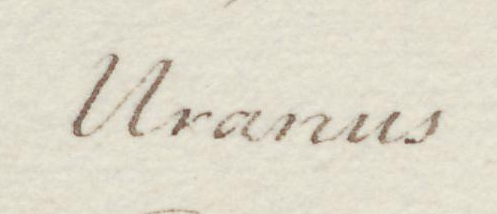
Uranus
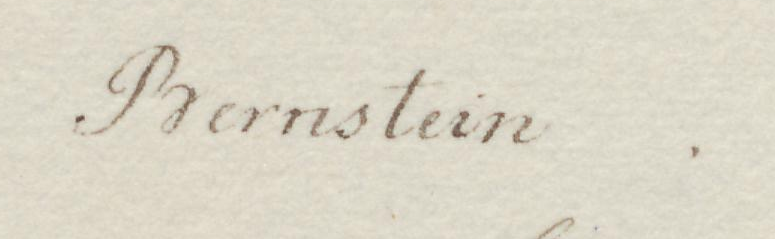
Bernstein,
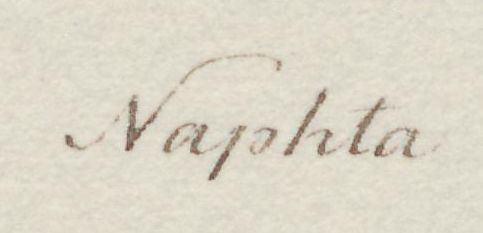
Naphta,
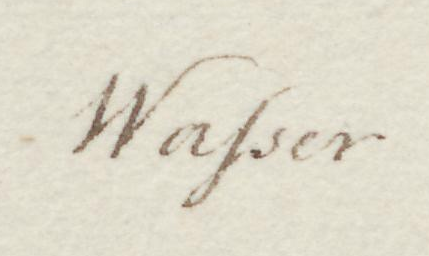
Wasser,
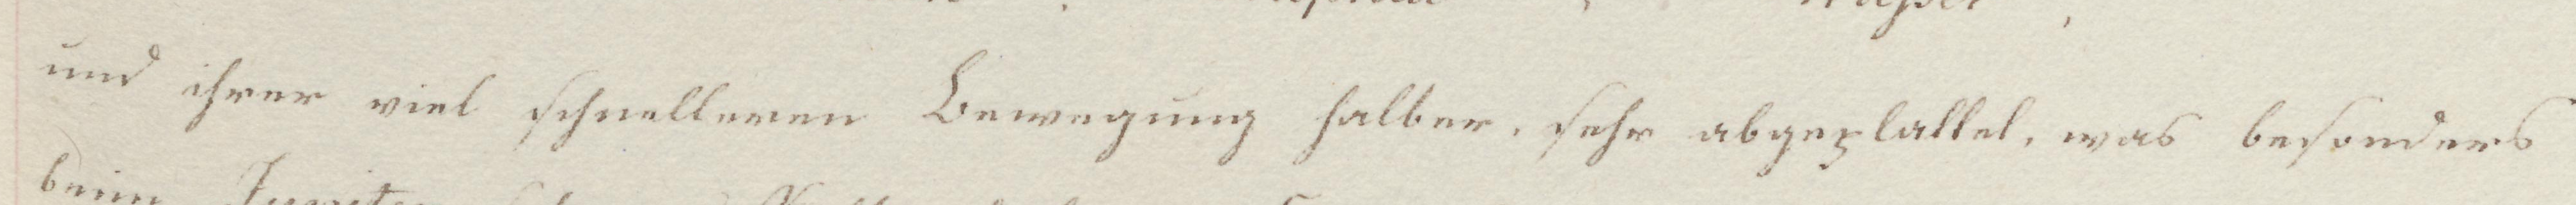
und ihrer viel schnelleren Bewegung halber, sehr abgeplattet, was besonders
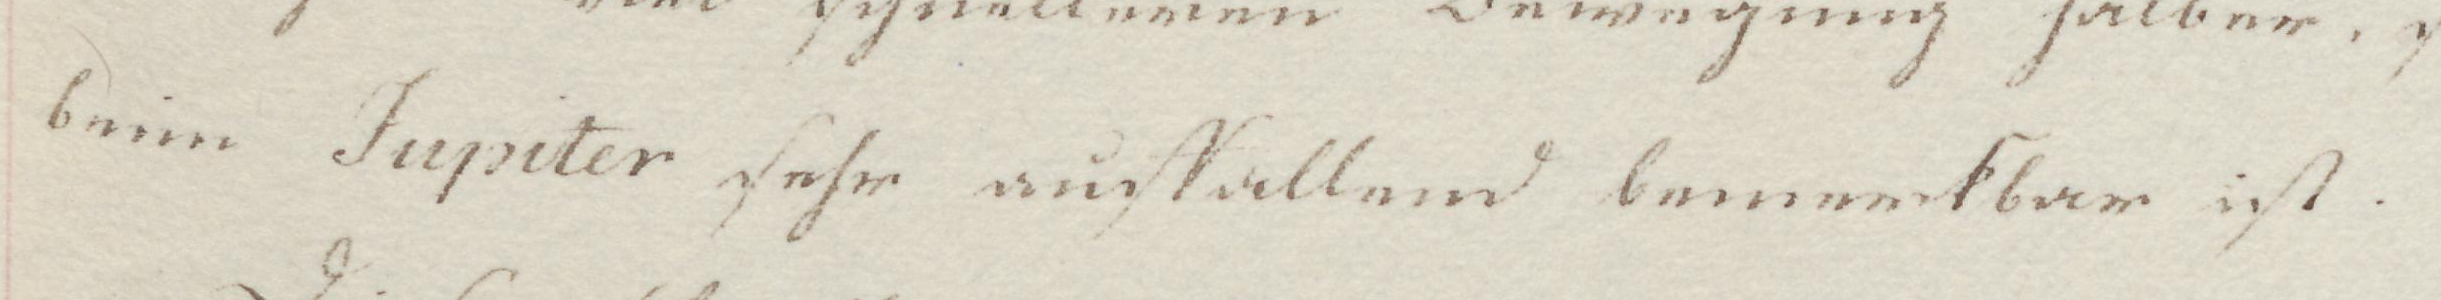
beim Jupiter sehr auffallend bemerkbar ist.
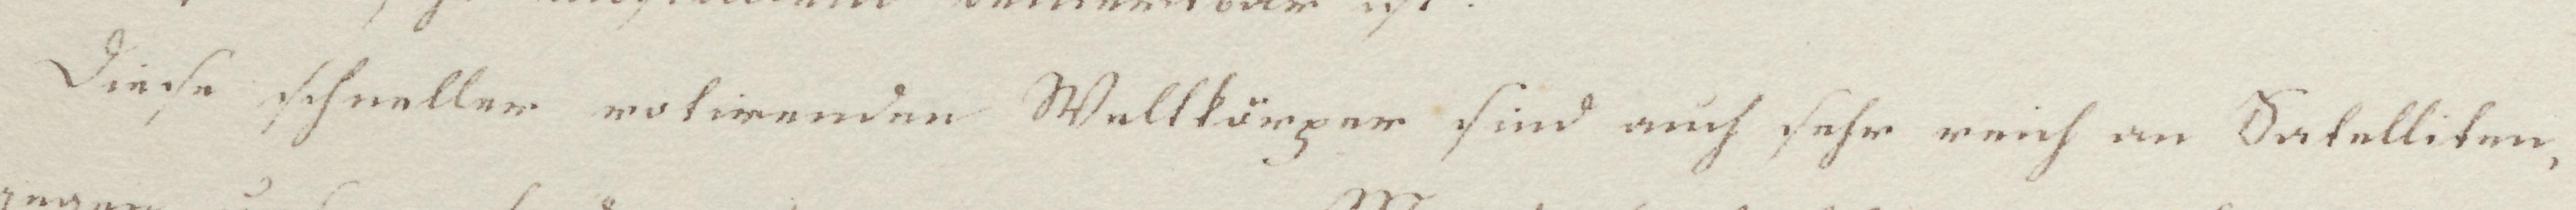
Diese schneller rotirenden Weltkörper sind auch sehr reich an Satelliten,
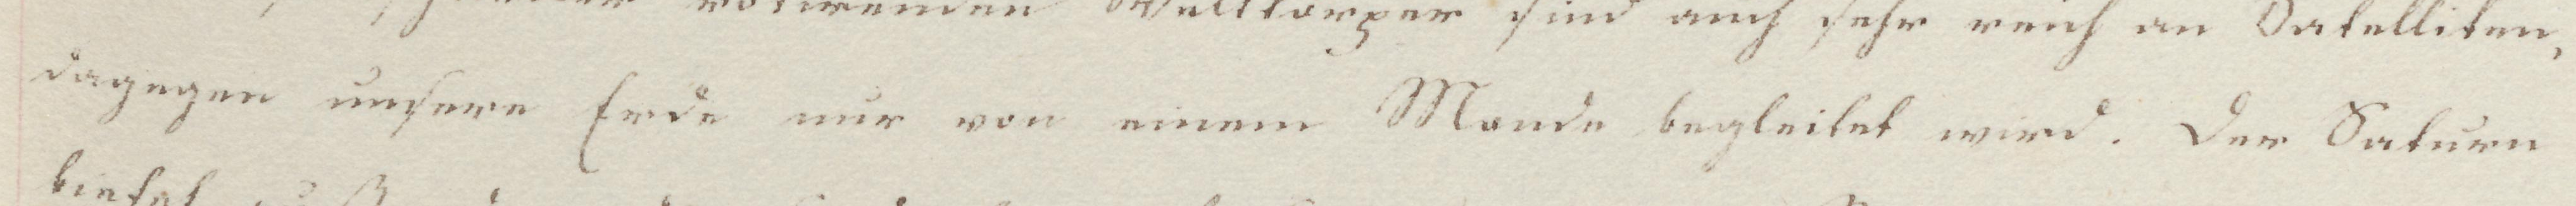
dagegen unsere Erde nur von einem Monde begleitet wird. Der Saturn
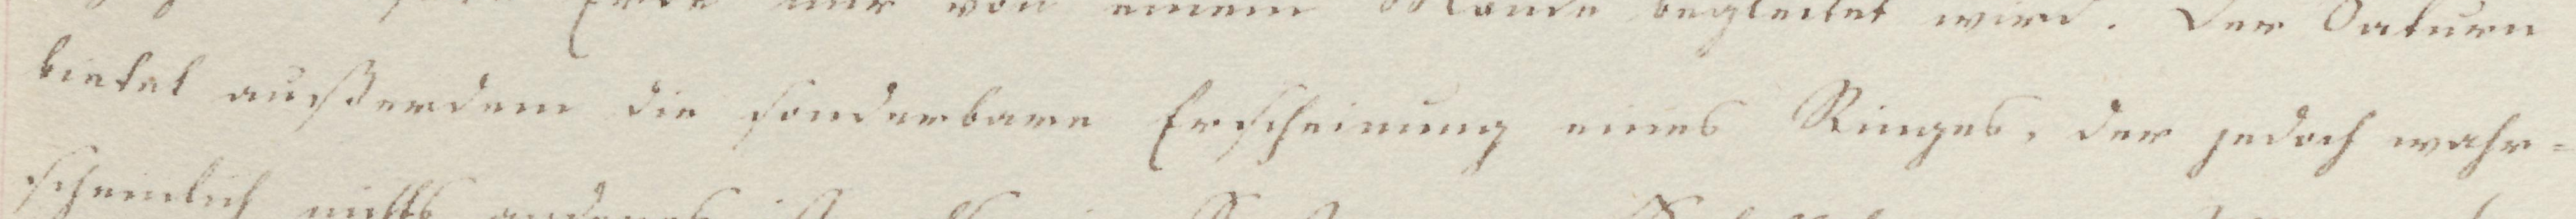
bietet außerdem die sonderbare Erscheinung eines Ringes, der jedoch wahr-
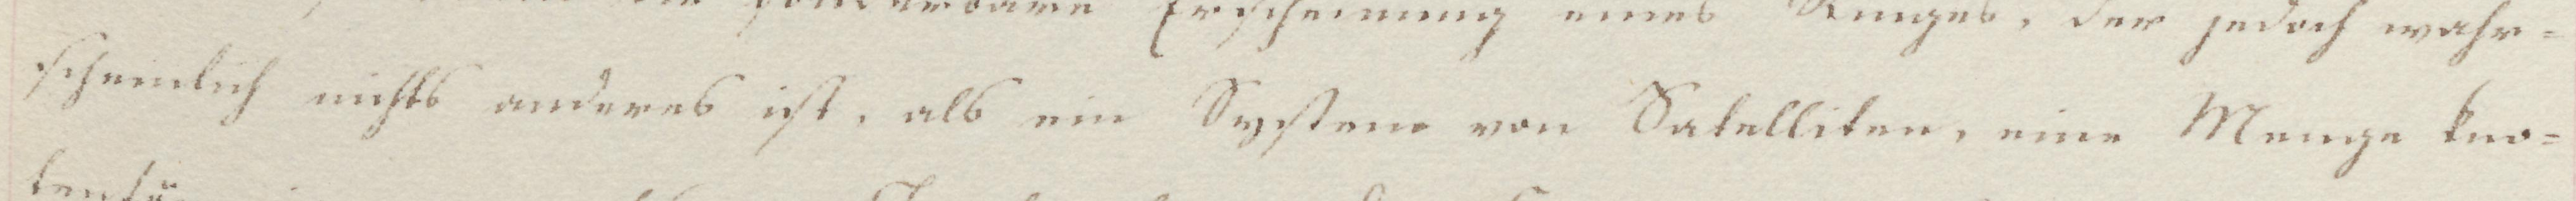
scheinlich nichts anderes ist, als ein System von Satelliten, eine Menge kno-
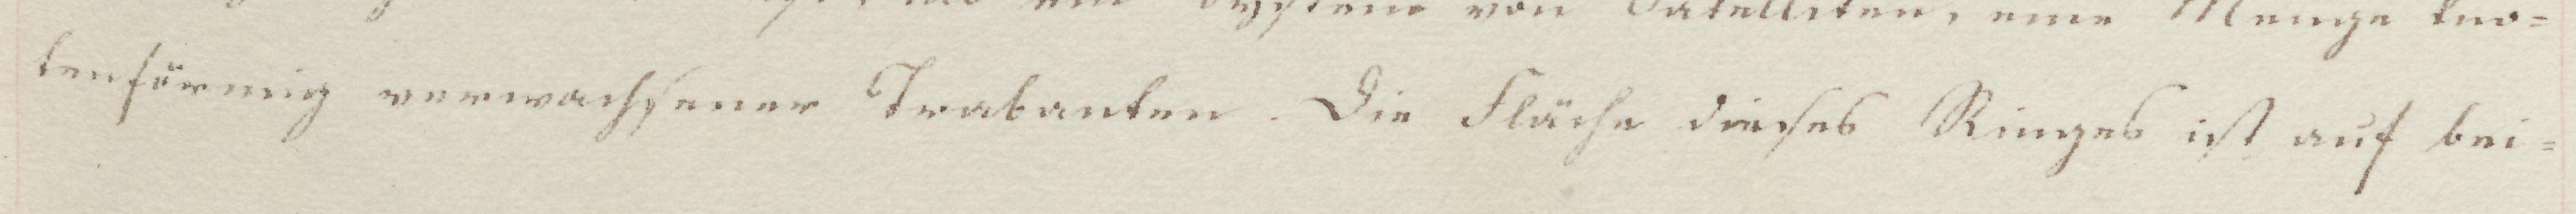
tenförmig verwachsener Trabanten. Die Fläche dieses Ringes ist auf bei-
